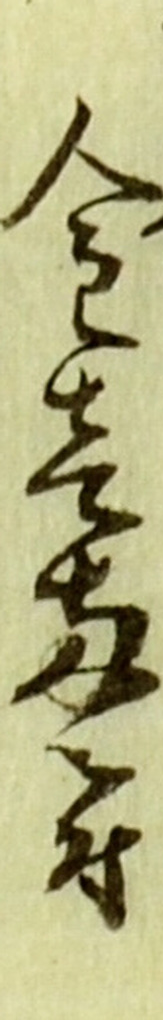金壱両ニ付
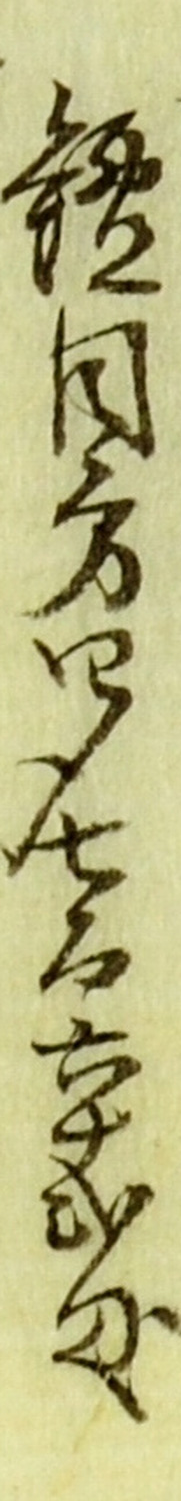鱣目方四〆七百六十二匁
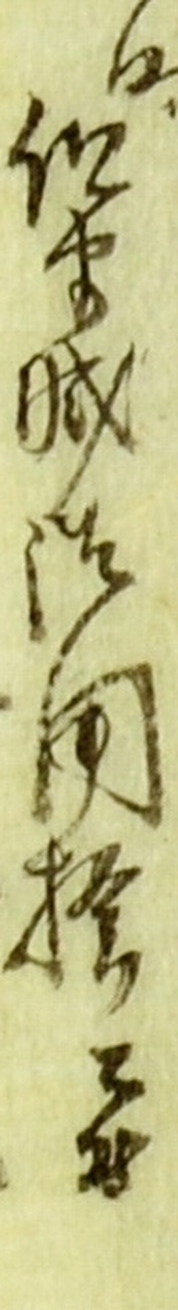但半臓御用捨ニ付

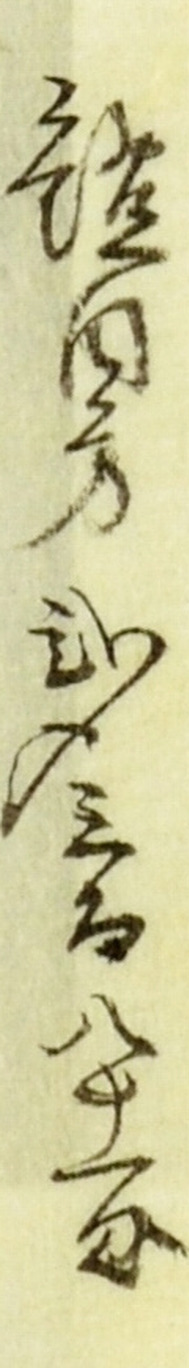鱣目方弐〆三百八十匁
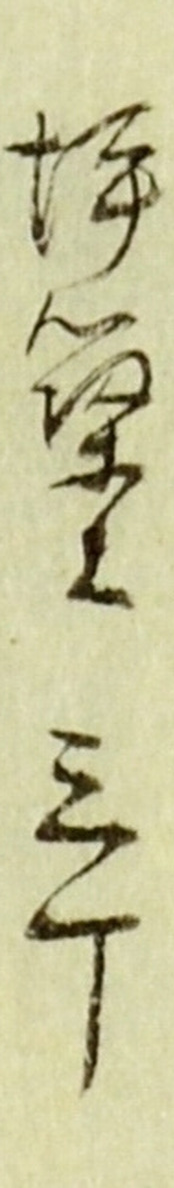坪簗上三丁
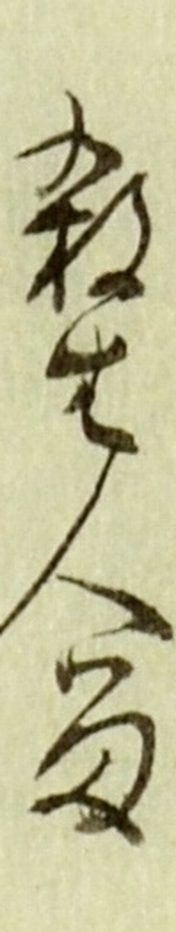殺生人留
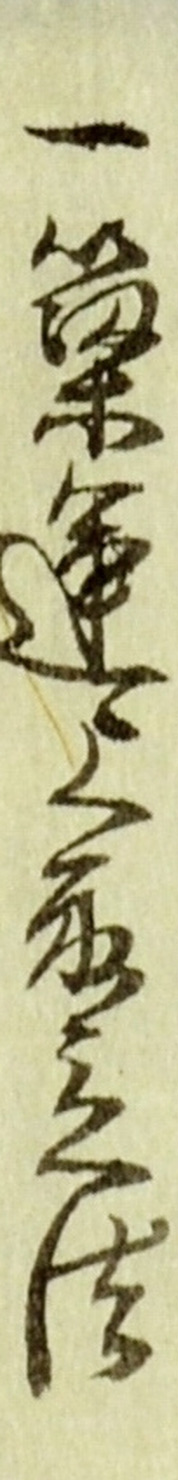一簗運上取立法
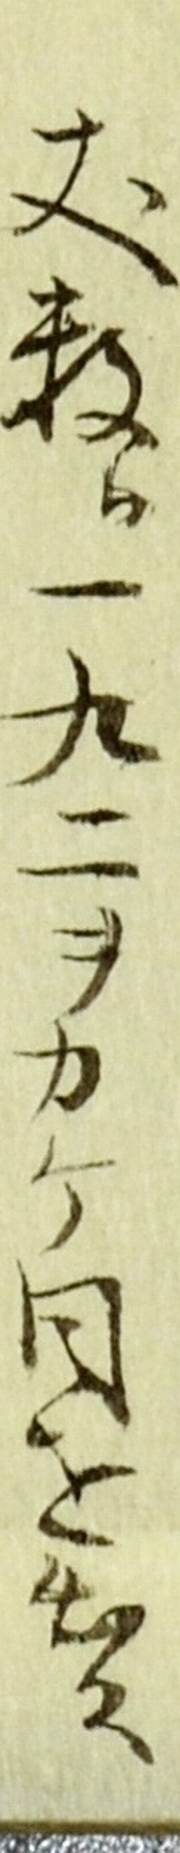丈数二一九二ヲカケ同を出ス
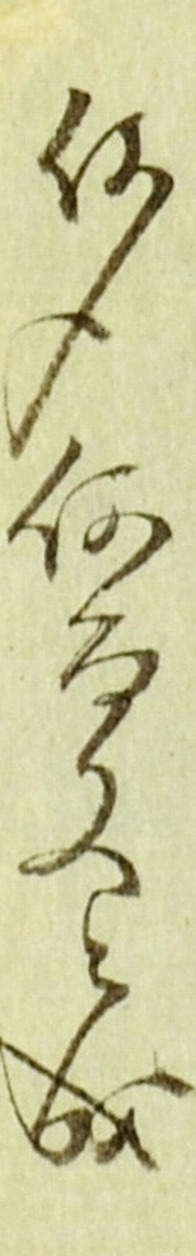何〆何百文と成
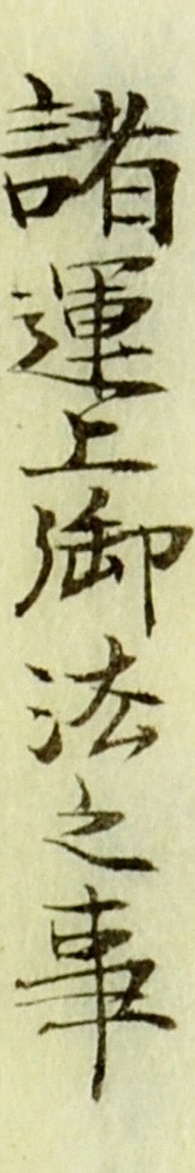諸運上御法之事
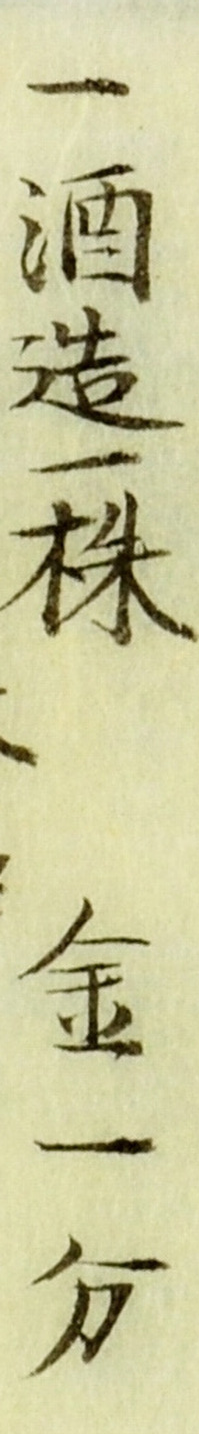一酒造一株金一分
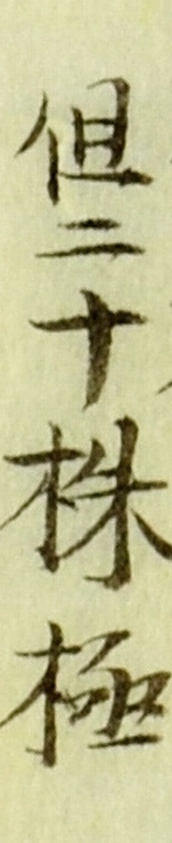但二十株極
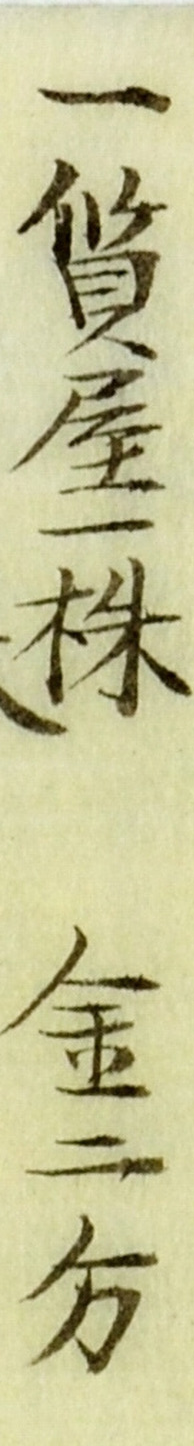一質屋一株金二分
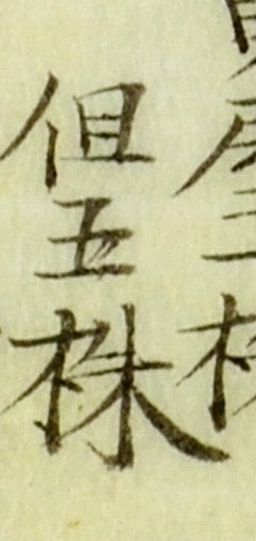但五株
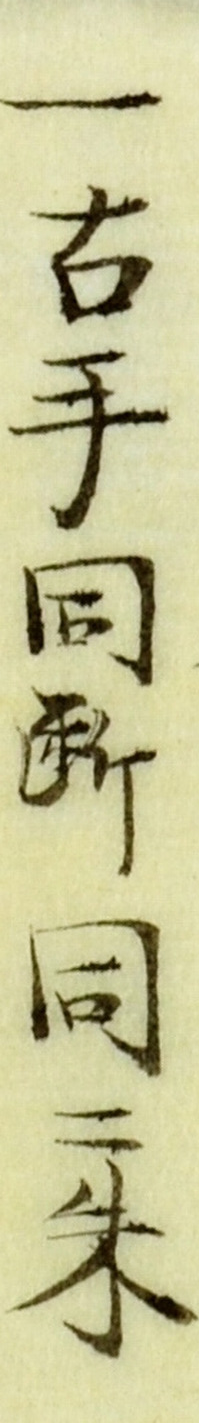一古手同断同二朱
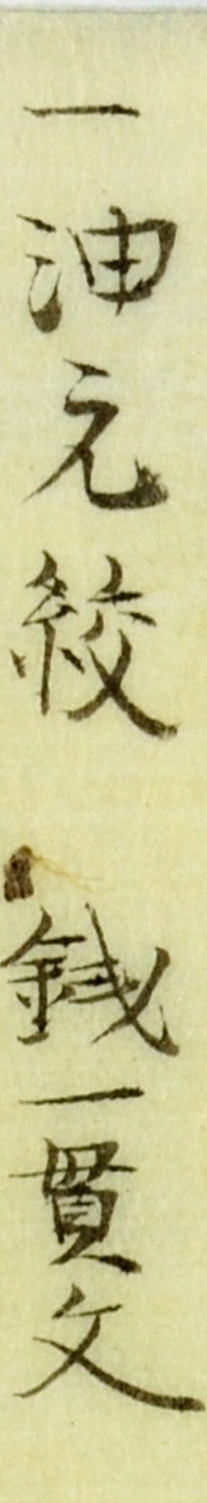一油元絞銭一貫文
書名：分一御定法
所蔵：伊那市立高遠町図書館・合同会社AMANE
